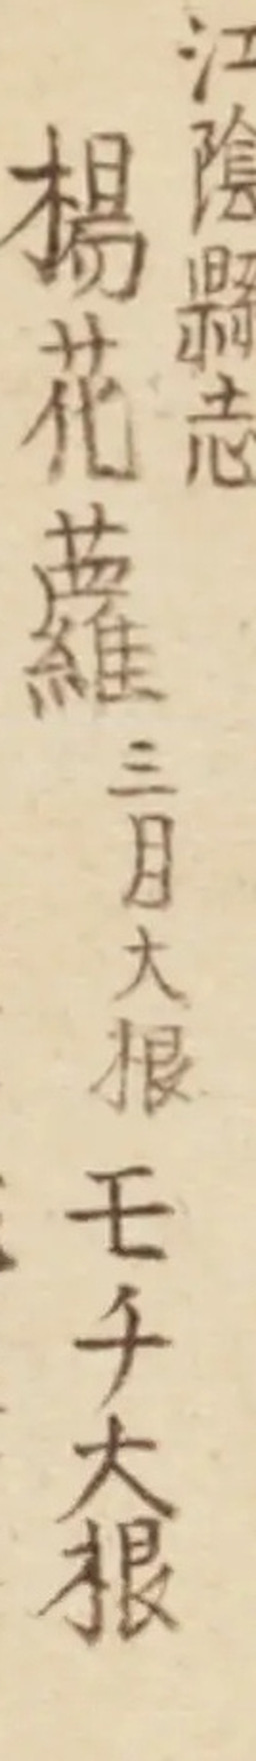楊花蘿三月大根もち大根
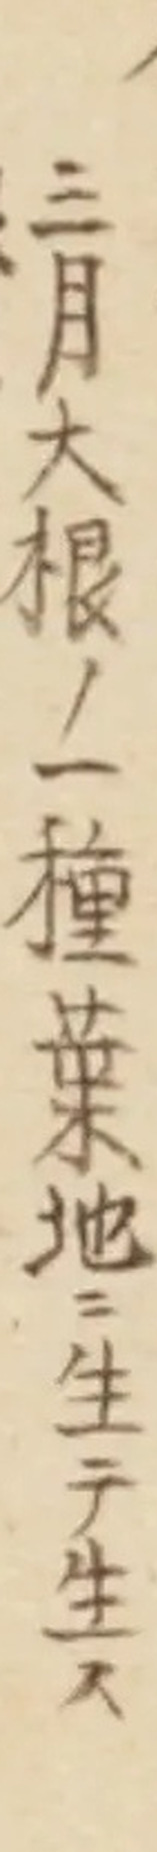三月大根の一種葉地に生て生す
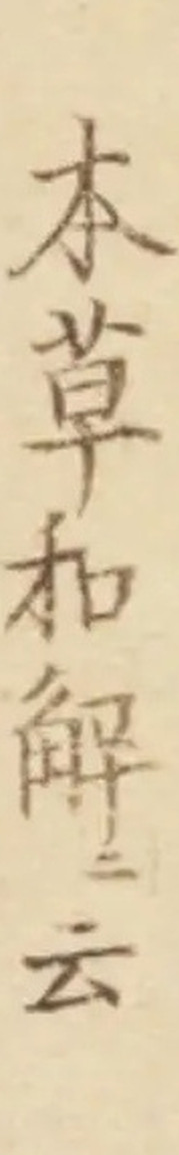本草和解に曰
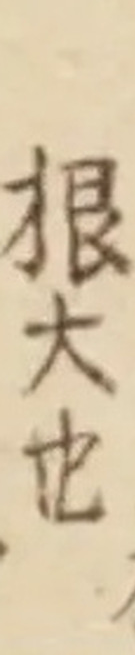根大也
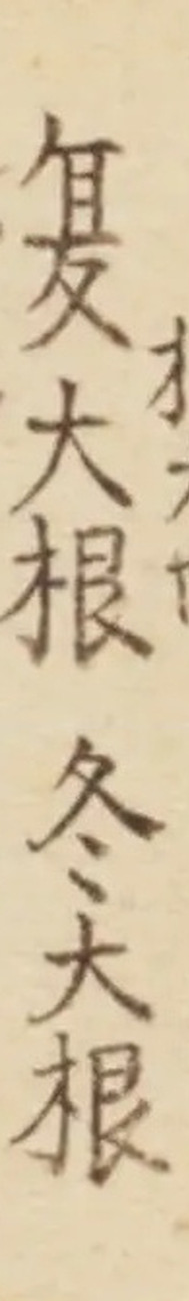夏大根冬大根
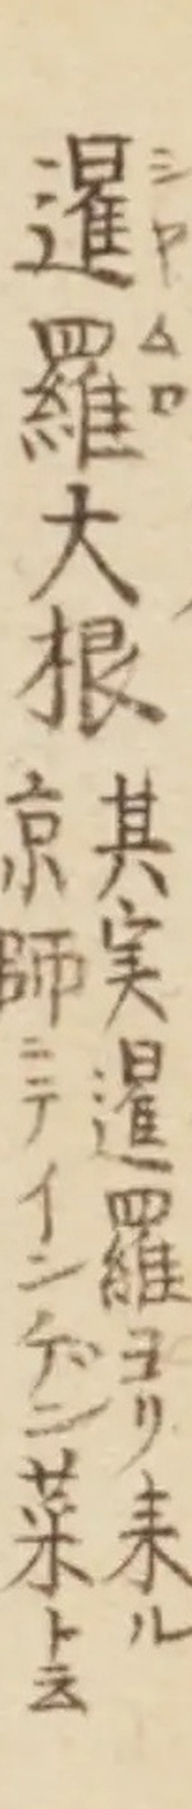暹羅大根其の実暹羅より来る
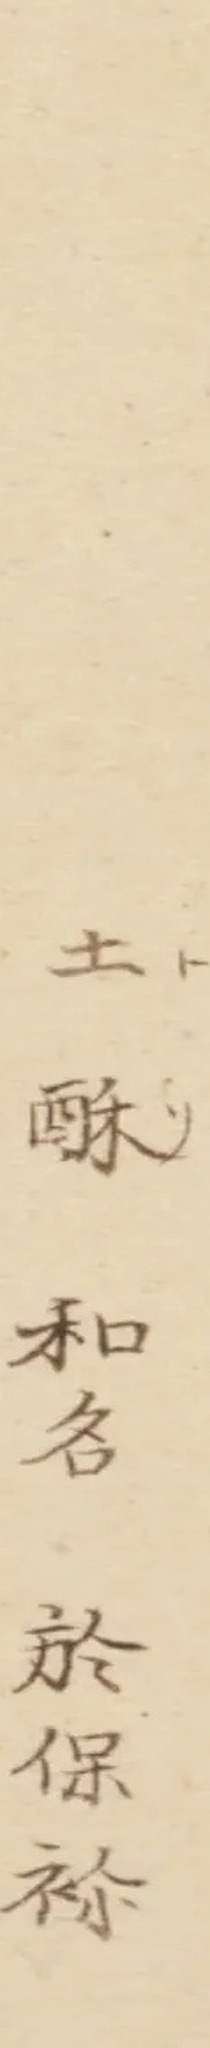土酥和名於保袮
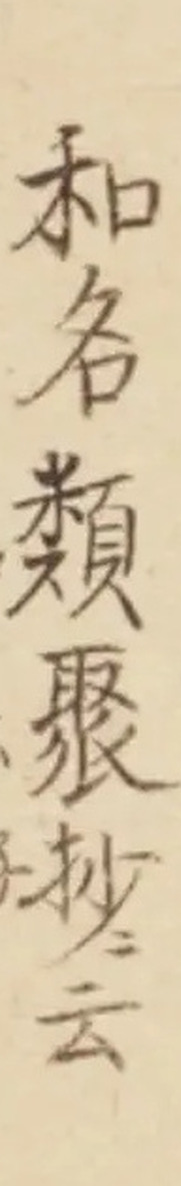和名類聚抄ニ云
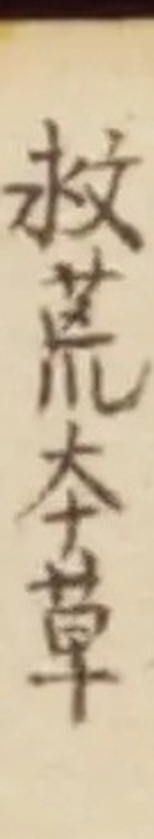救荒本草
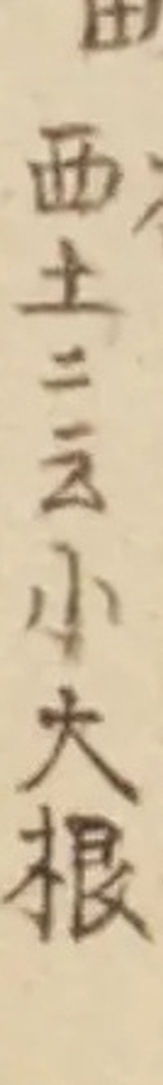西口に云個小大根
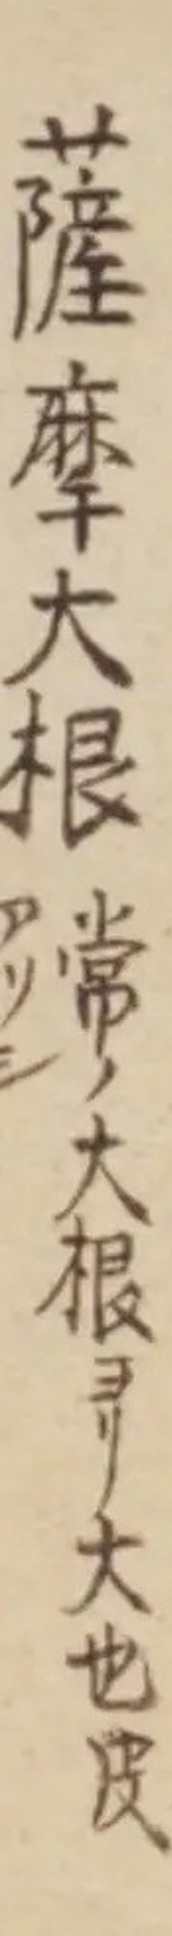薩摩大根常の大根より大也皮
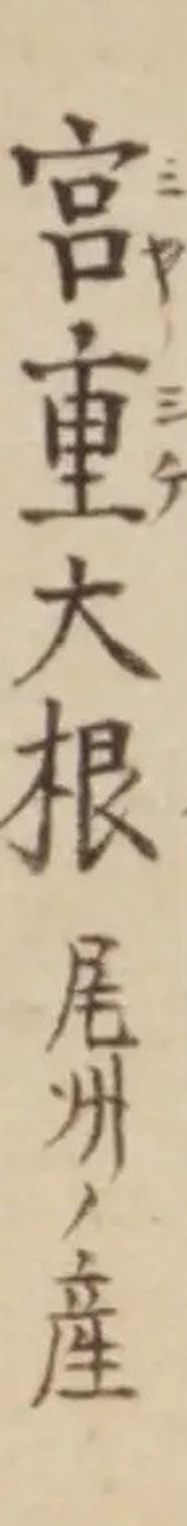宮重大根尾州の産

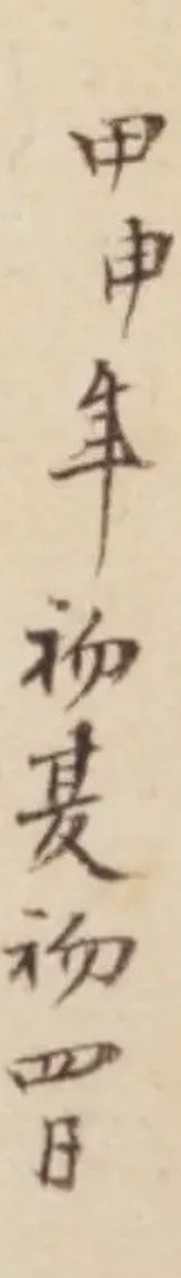甲申年初夏初四日
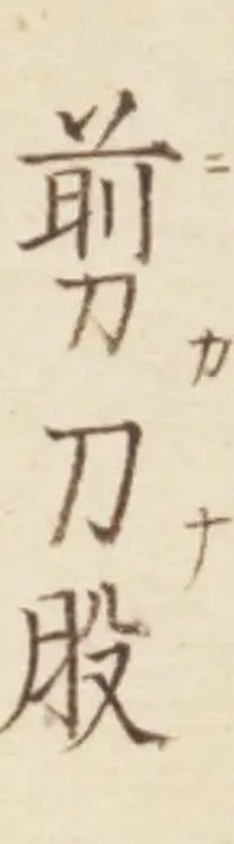剪刀股
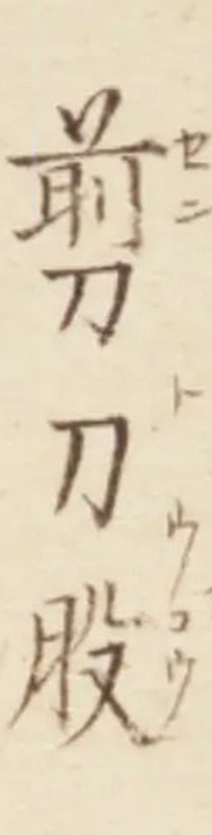剪刀股
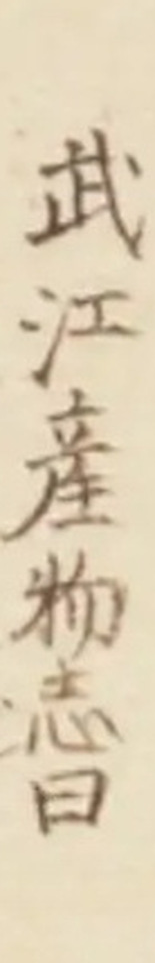武江産物志曰
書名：梅園草木花譜夏之部. 2
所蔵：国立国会図書館 National Diet Library, JAPAN
